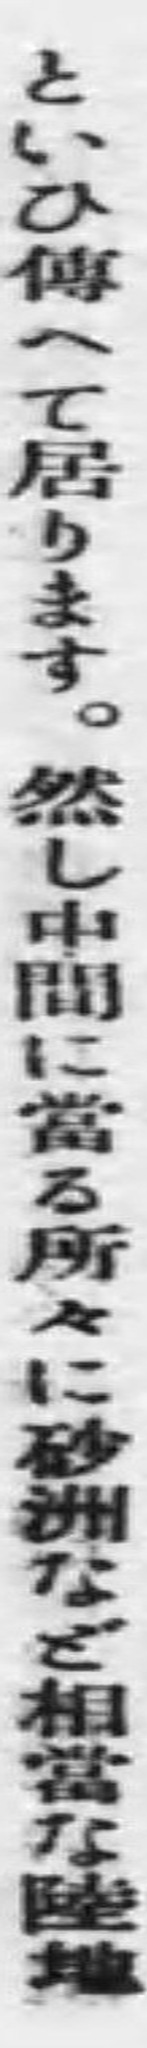といひ傳へて居ります。然し中間に當る所々に砂洲など相當な陸地
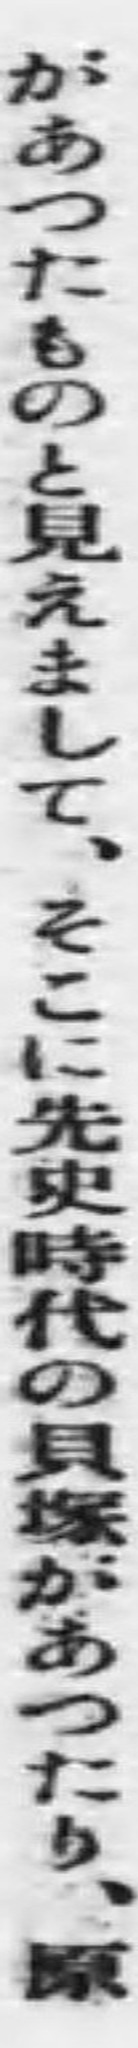があつたものと見えまして、そこに先史時代の貝塚があつたり、原
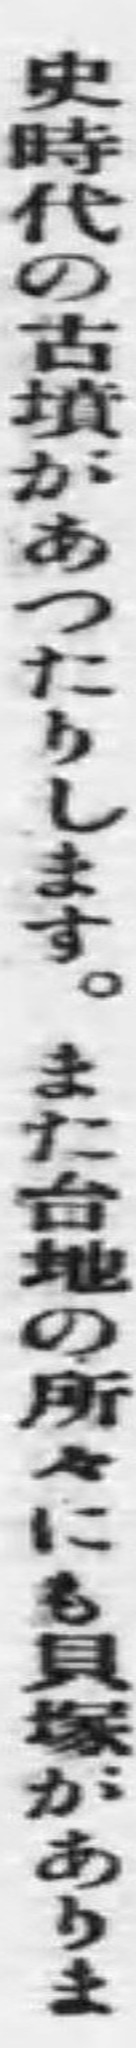史時代の古墳があつたりします。また台地の所々にも貝塚がありま

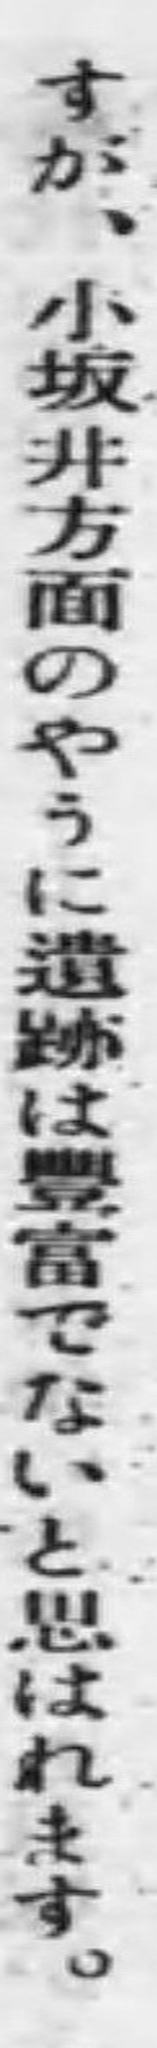すが、小坂井方面のやうに遺跡は豊富でないと思はれます。
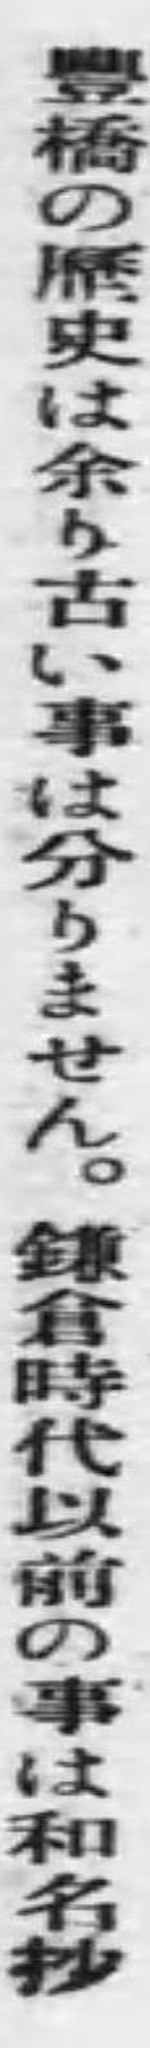豊橋の歴史は余り古い事は分りません。鎌倉時代以前の事は和名抄
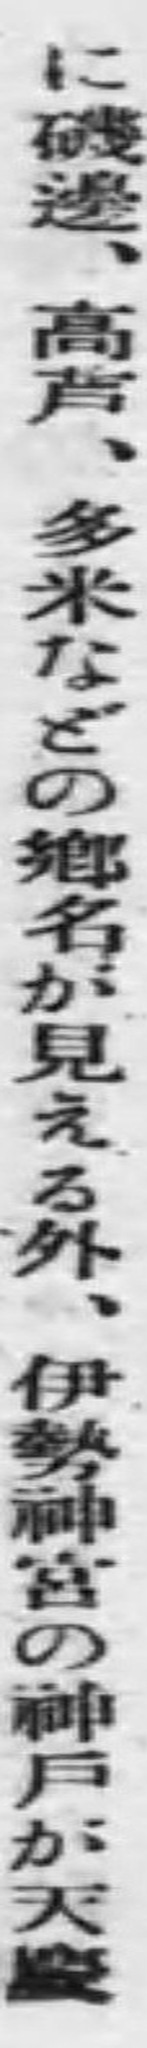に磯邊、高芦、多米などの郷名が見える外、伊勢神宮の神戸が天慶
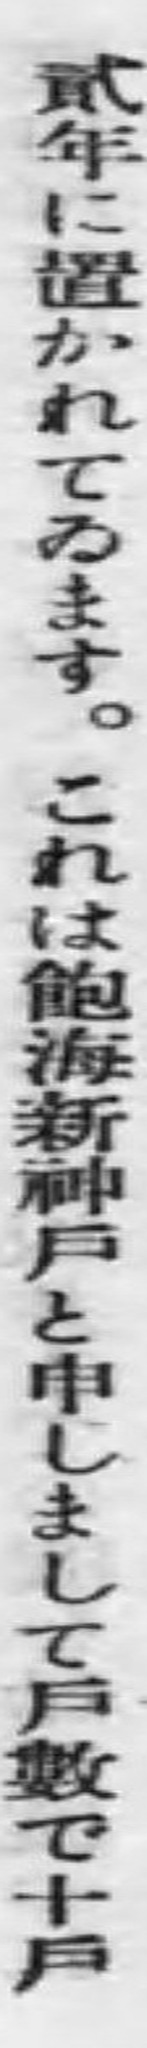弐年に置かれてゐます。これは飽海新神戸と申しまして戸数で十戸
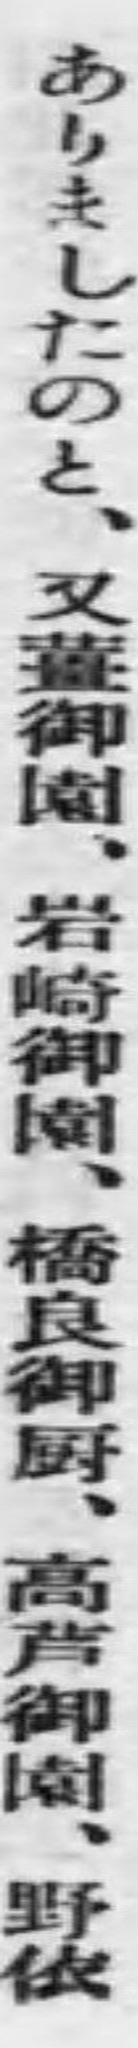ありましたのと、又薑御園、岩崎御園、橋良御厨、高芦御園、野依
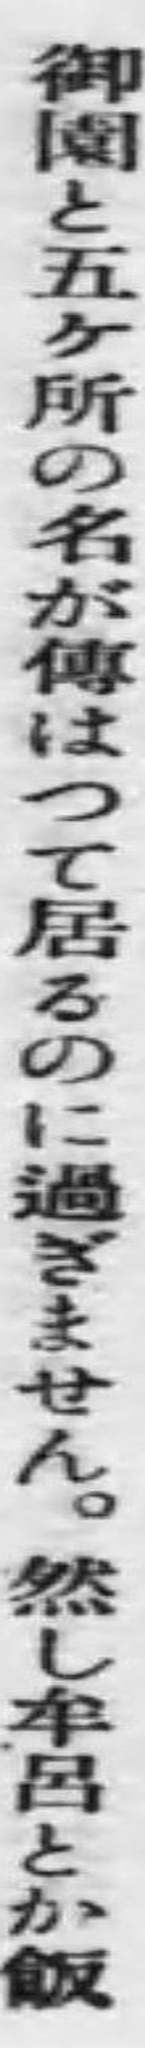御園と五ヶ所の名が伝はつて居るのに過ぎません。然し牟呂とか飯
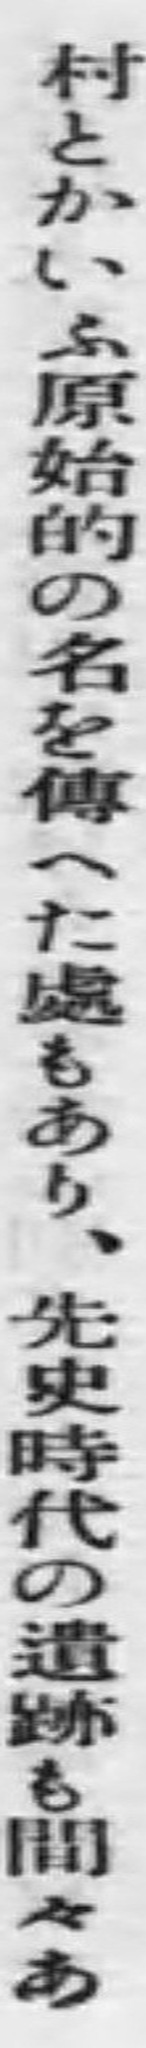村とかいふ原始的の名を伝へた処もあり、先史時代の遺跡も間々あ
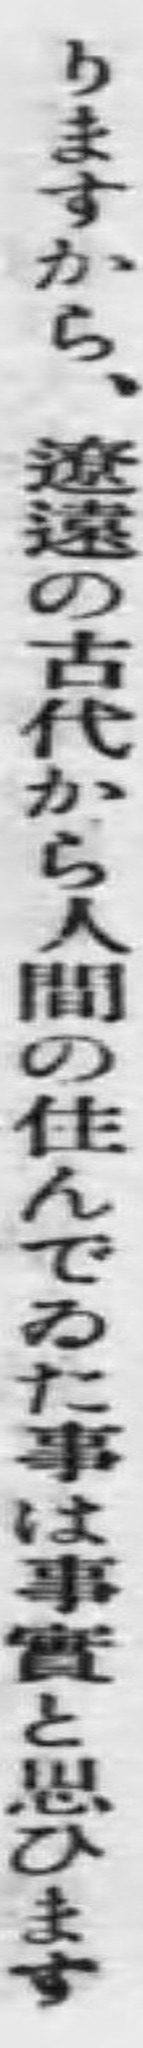りますから、遼遠の古代から人間の住んでゐた事は事実と思ひます
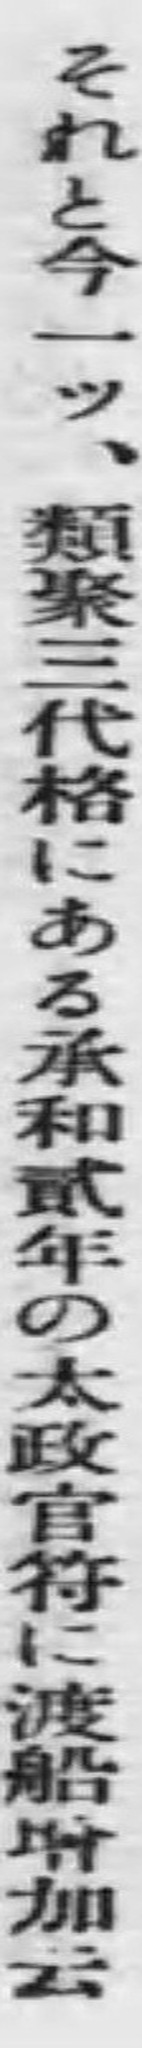それと今一ツ、類聚三代格にある承和弐年の太政官符に渡船増加云
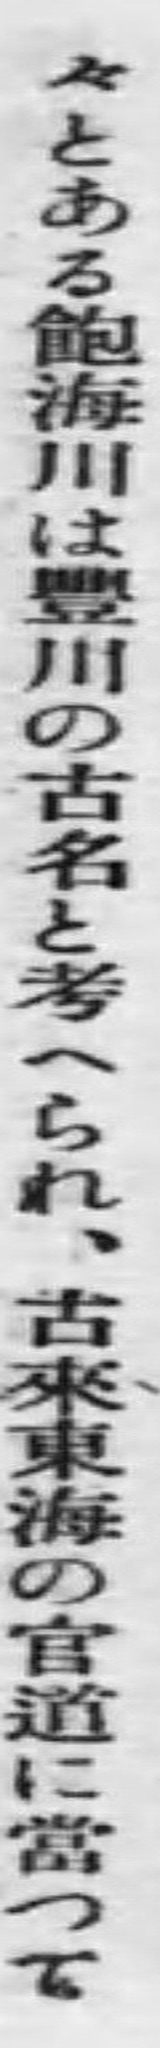々とある飽海川は豊川の古名と考へられ、古来東海の官道に当つて
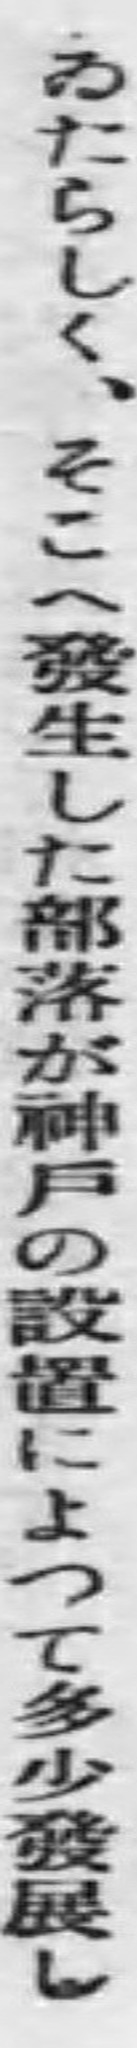ゐたらしく、そこへ発生した部落が神戸の設置によつて多少発展し
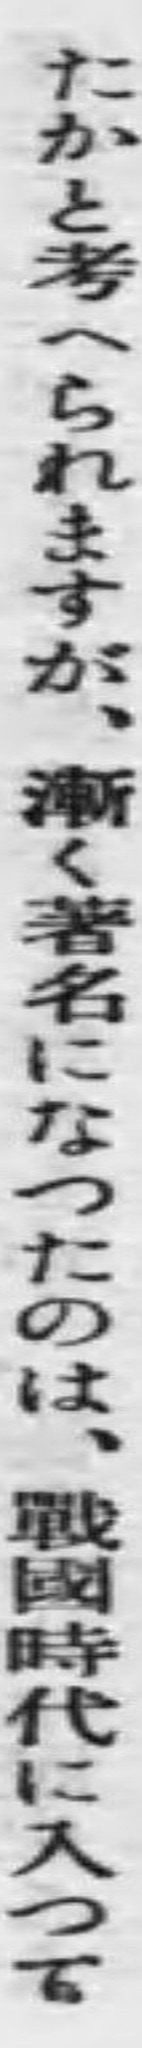たかと考へられますが、漸く著名になつたのは、戦国時代に入つて
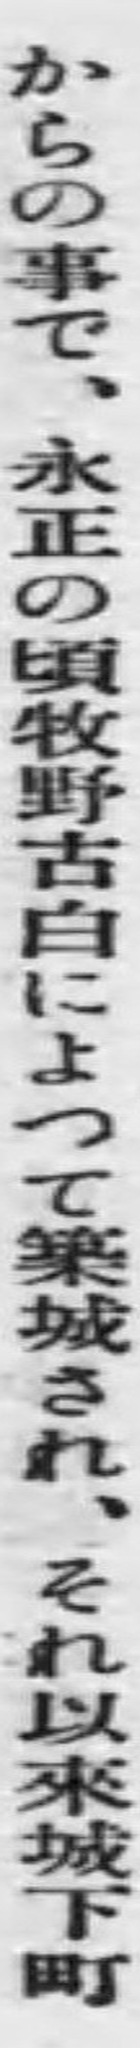からの事で、永正の頃牧野古白によつて築城され、それ以来城下町
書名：東三河道中記 : 豊橋市及其附近案内
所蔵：国立国会図書館 National Diet Library, JAPAN
